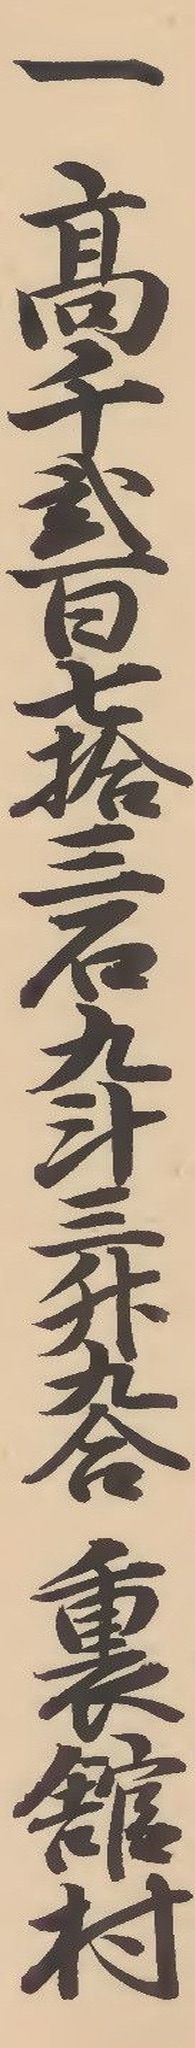一高千弐百七拾三石九斗三升九合裏舘村
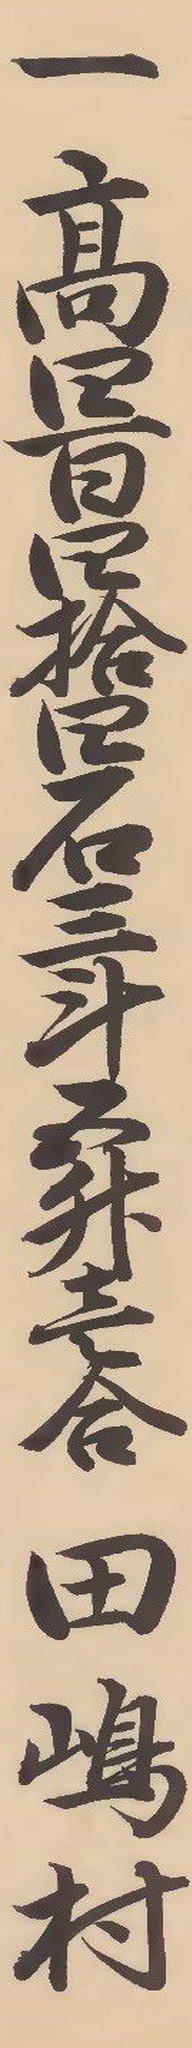一高四百四拾四石三斗五升壱合田島村
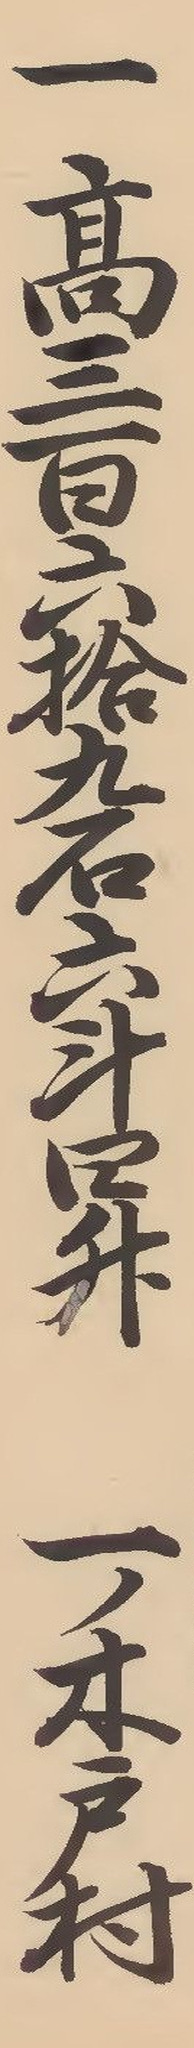一高三百六拾九石六斗四升一ノ木戸村

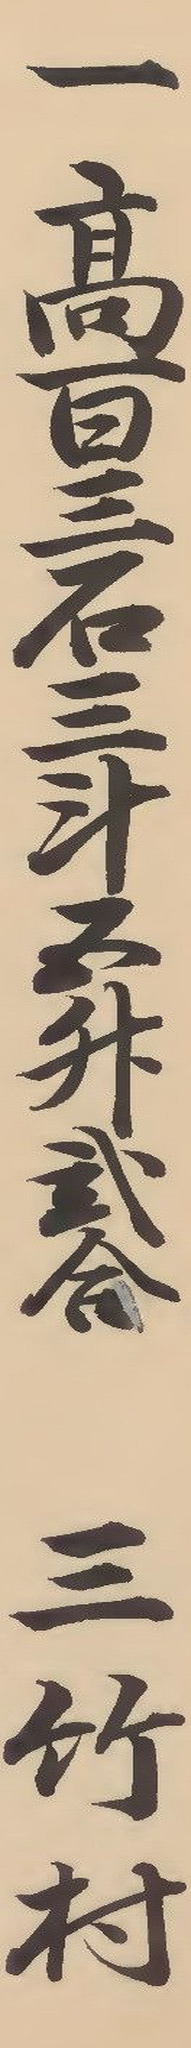一高百三石三斗五升弐合三竹村
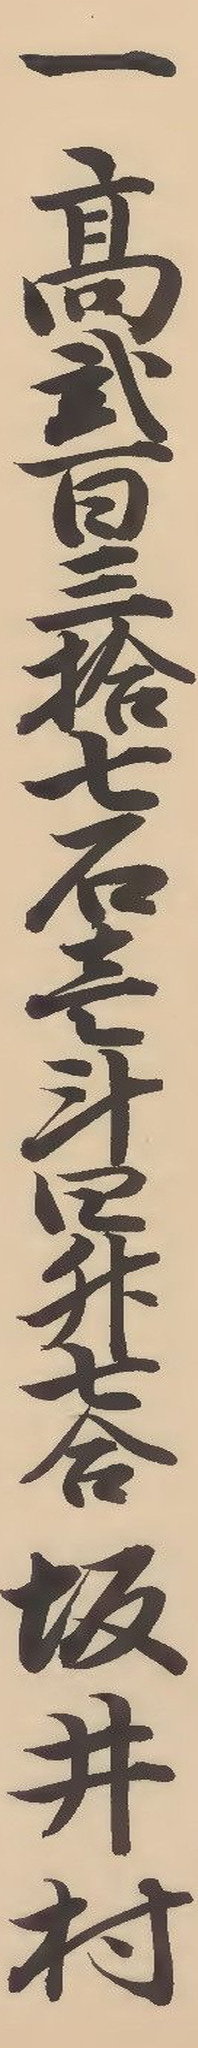一高弐百三拾七石壱斗四升七合坂井村
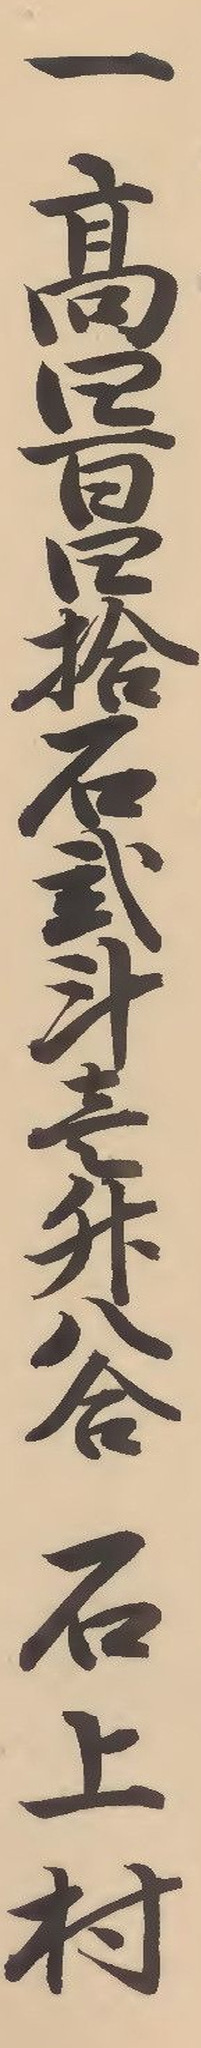一高四百四拾石弐斗壱升八合石上村
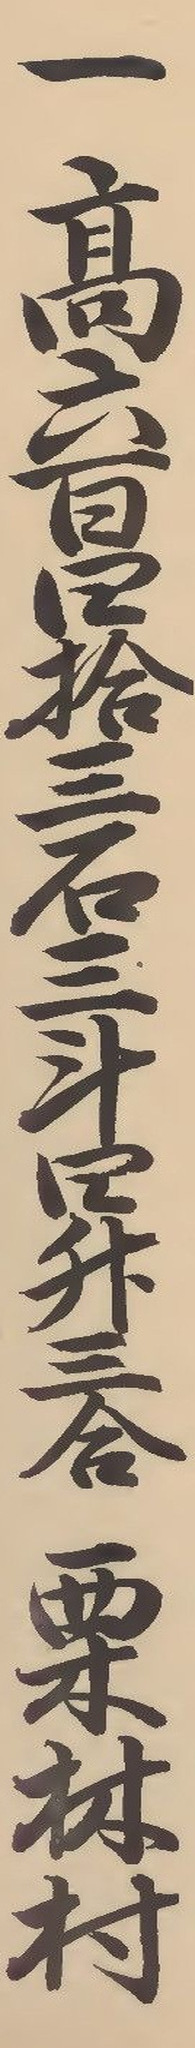一高六百四拾三石三斗四升三合栗林村
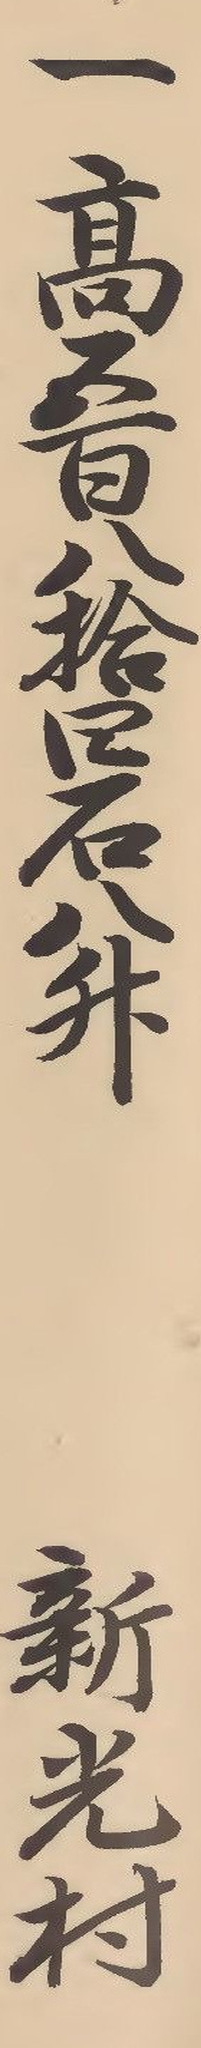一高五百八拾四石八升新光村
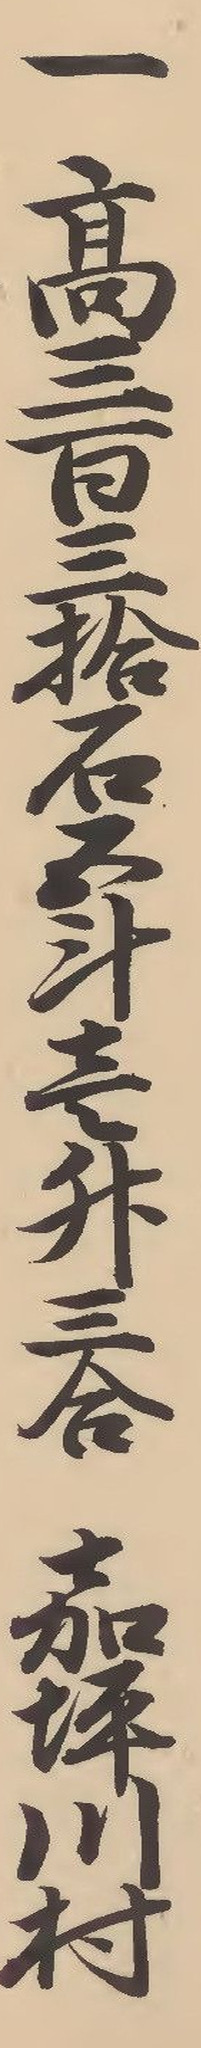一高三百三拾石五斗壱升三合嘉坪川村
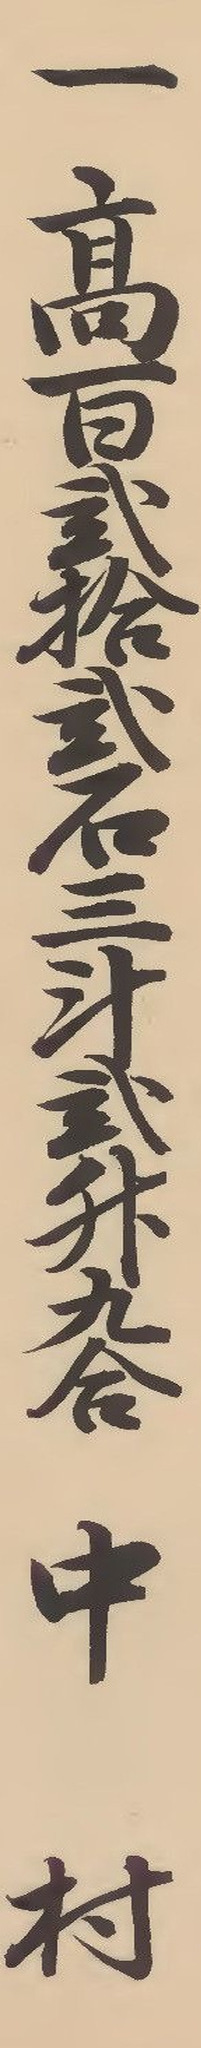一高百弐拾弐石三斗弐升九合中村
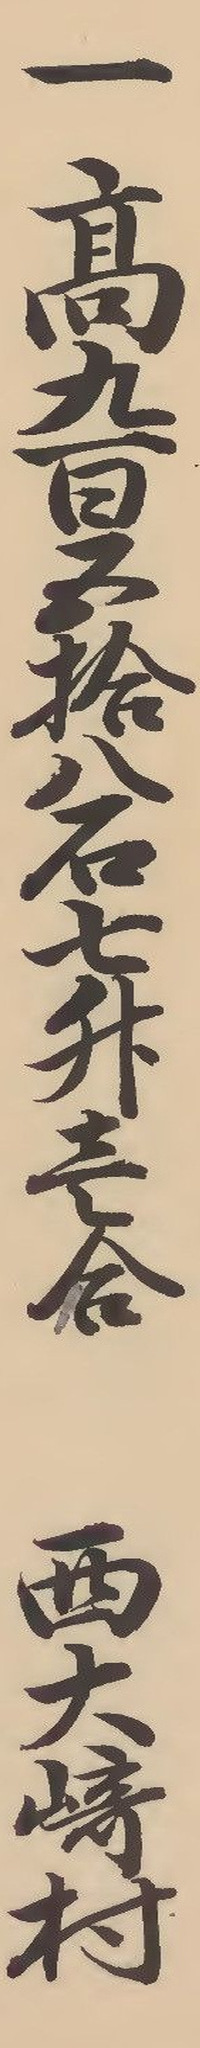一高九百五拾八石七升壱合西大崎村

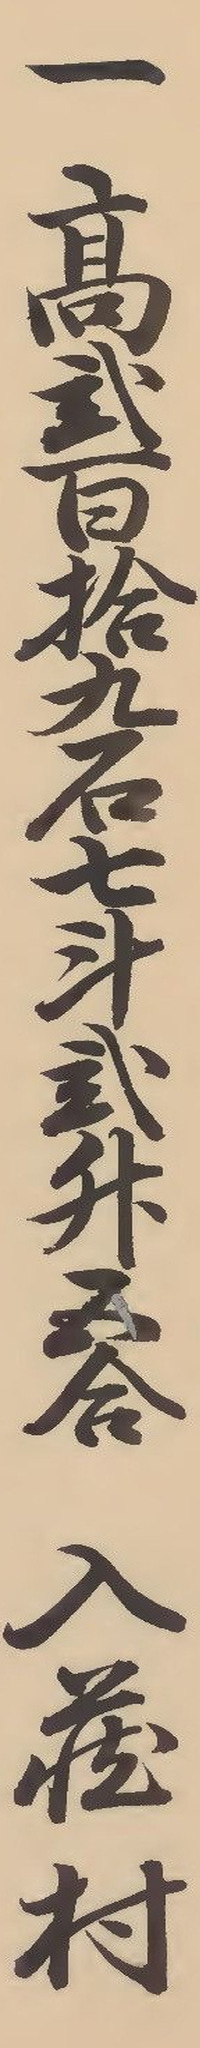一高弐百拾九石七斗弐升五合入蔵村
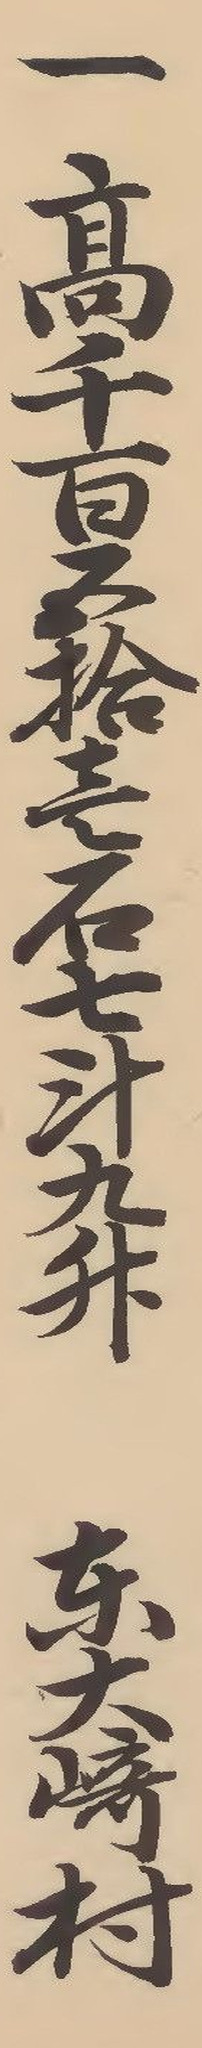一高千百五拾壱石七斗九升東大崎村
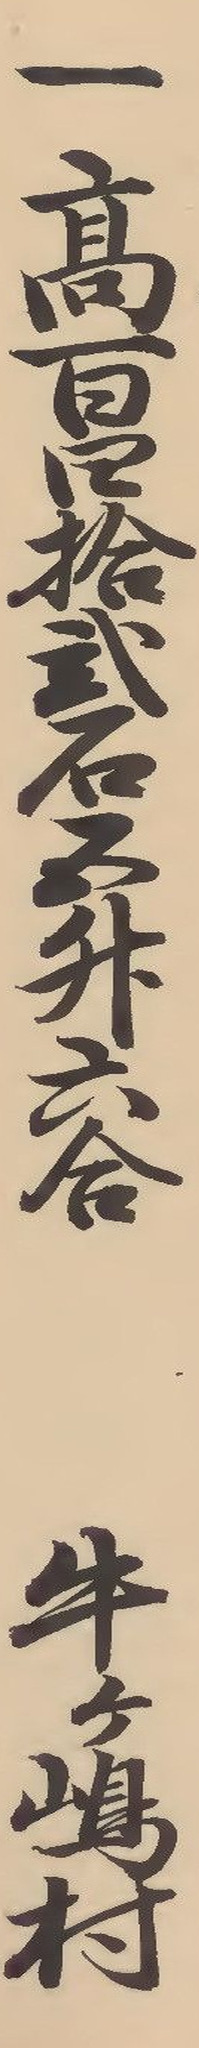一高百四拾弐石五升六合牛ヶ島村
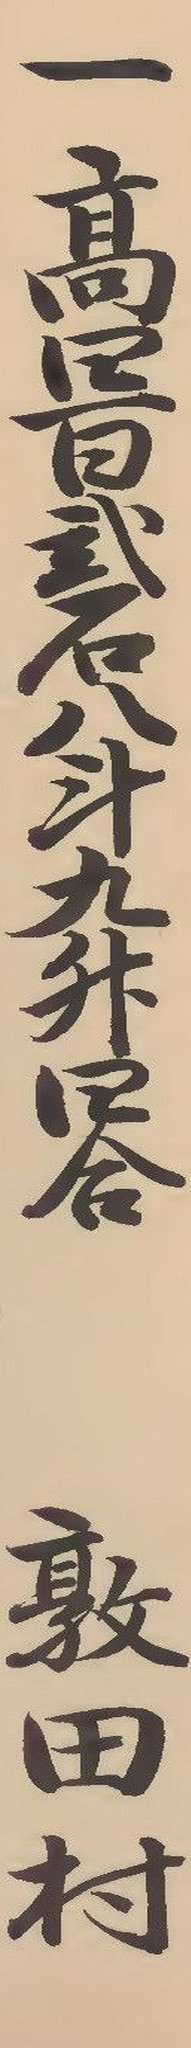一高四百弐石八斗九升四合敦田村
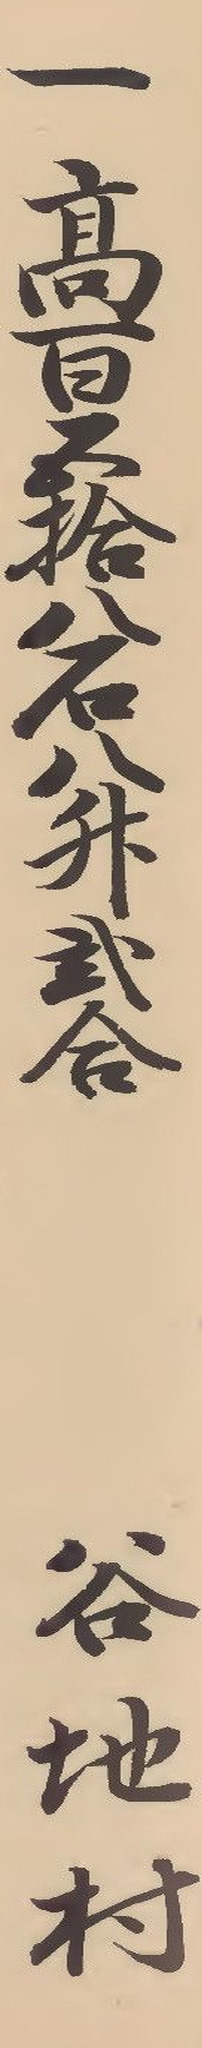一高百五拾八石八升弐合谷地村
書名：越後国郷帳　下
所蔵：国立公文書館 National Archives of Japan
